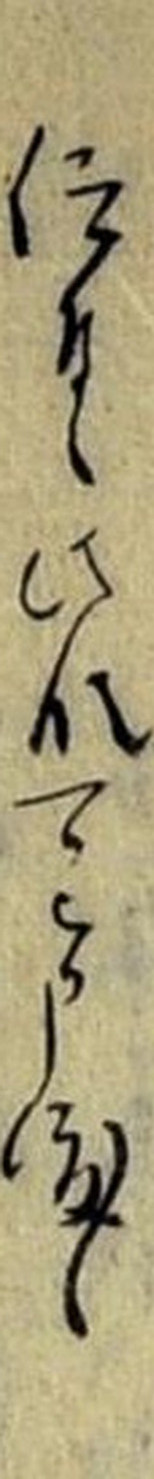仰付候此段可被申渡候
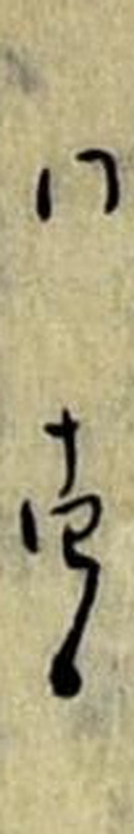同十四日
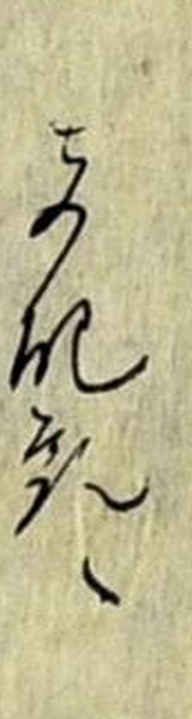支配頭へ
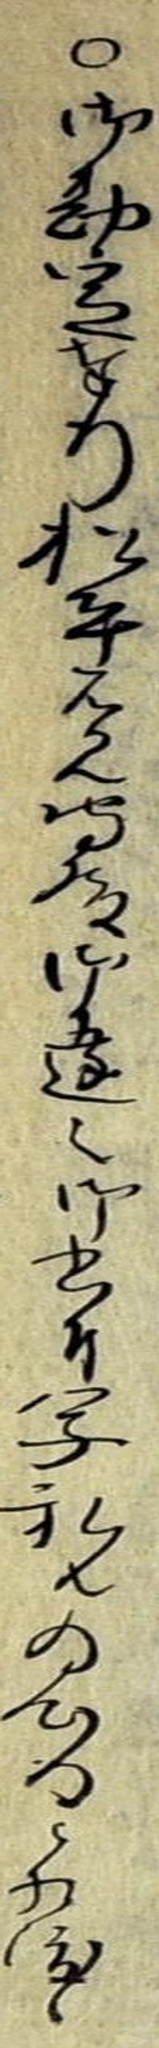○御勘定奉行松平石見守殿御達之御書付写私共為心得被相渡候
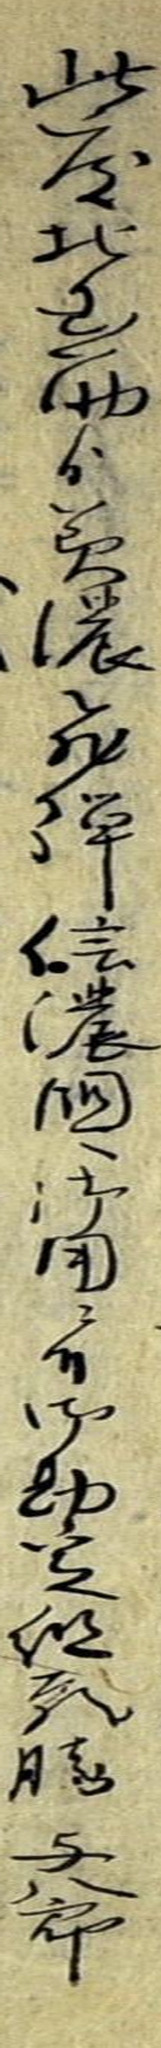此度北国筋ゟ美濃飛騨信濃国へ御用ニ付御勘定組頭勝与八郎
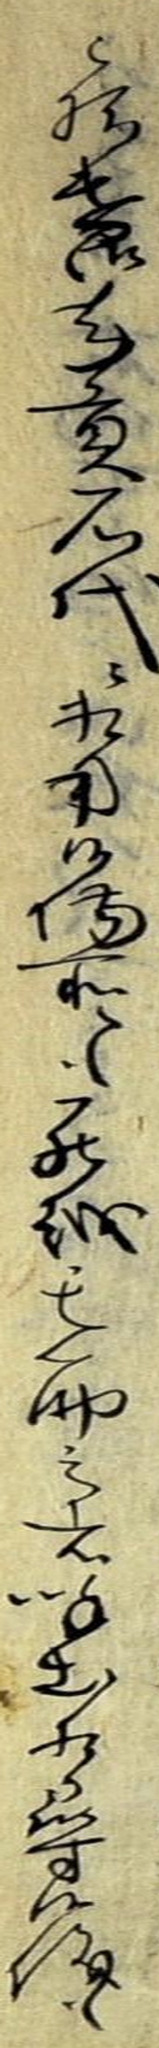被指遣御年貢石代ニ相用御備所へも罷越其筋之者呼出相尋候儀も

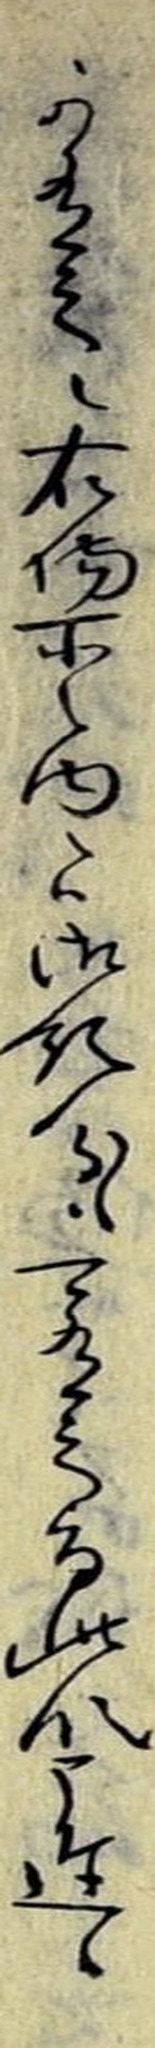可有之候右備所之内ニハ御領分も可有之候間此段申達候
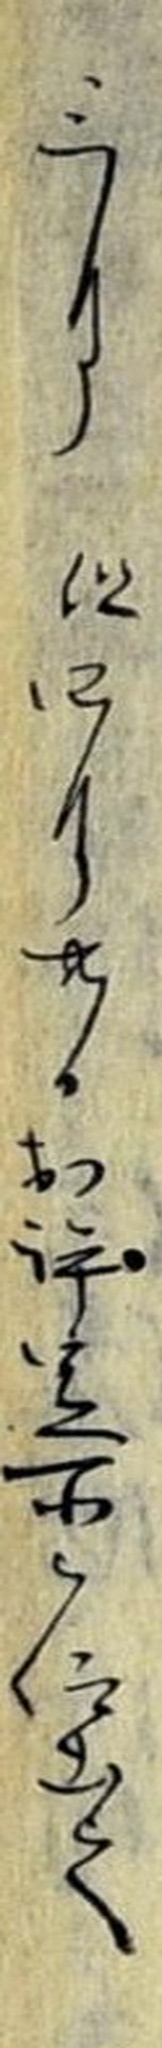三月但四月廿日於評定所被仰出之
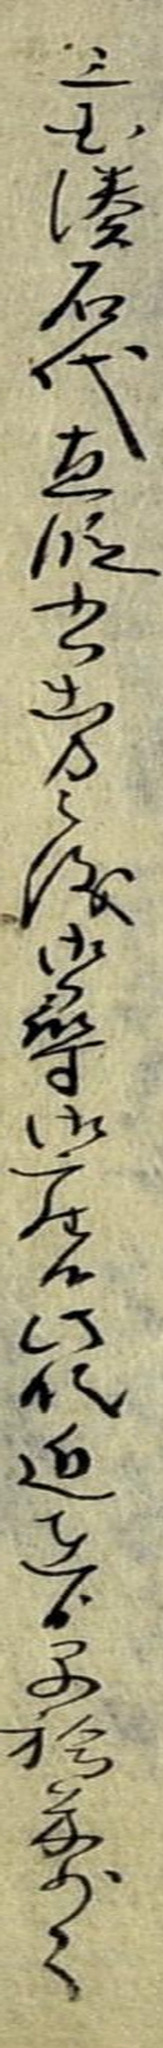三国湊石代直段書出方之儀御尋御座候此段近在ゟ早稲米少々
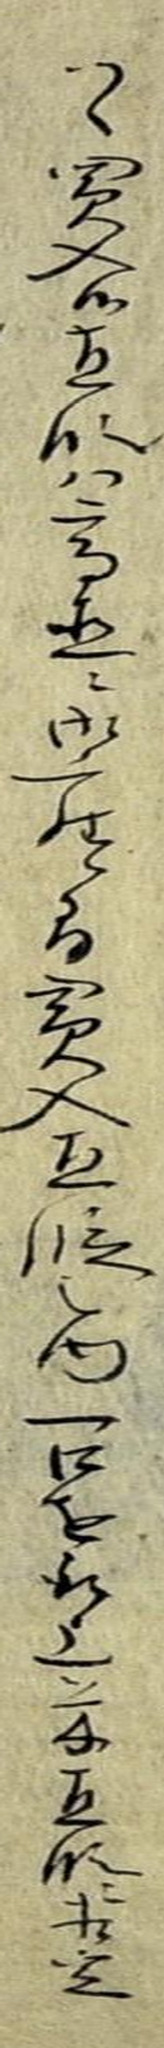ツヽ買入候直段ハ高直ニ御座候間買入直段之内一口を取上米直段ニ相定
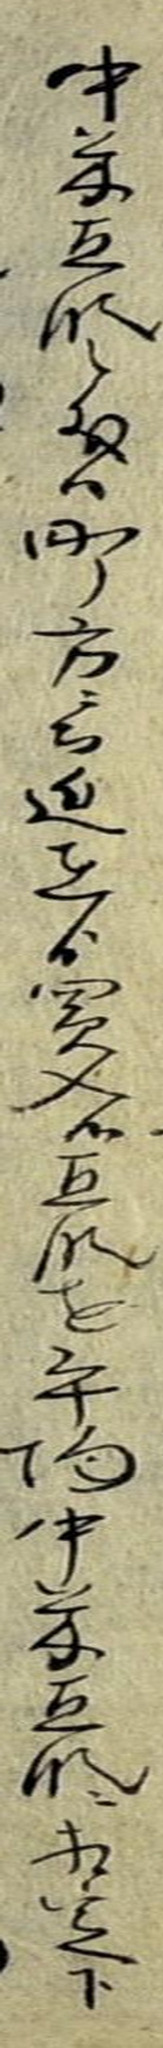中米直段之義ハ町方ニ而近在ゟ買入候直段を平均中米直段ニ相定下
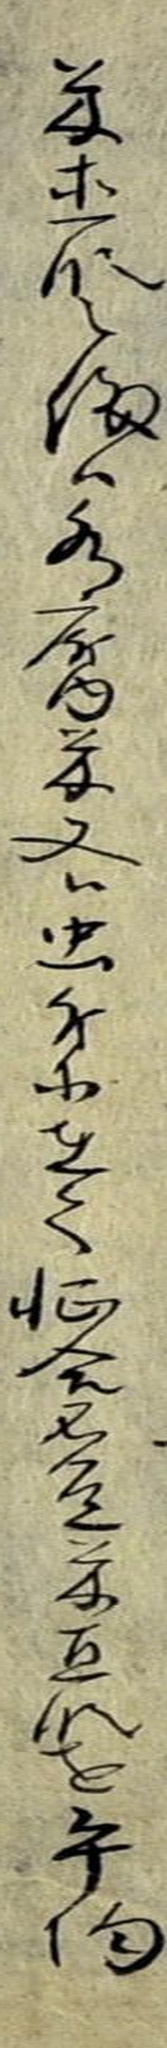米直段之儀ハ水腐米又ハ虫付等在之怔合不宜米直段を平均
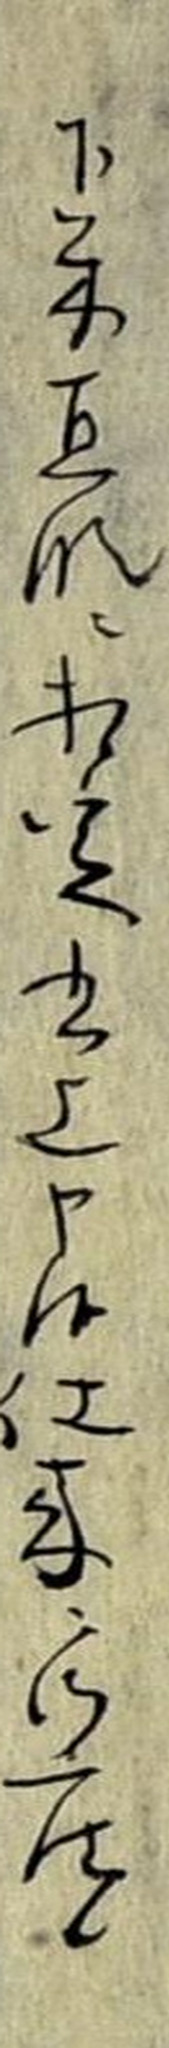下米直段ニ相定書上申候仕来ニ御座候
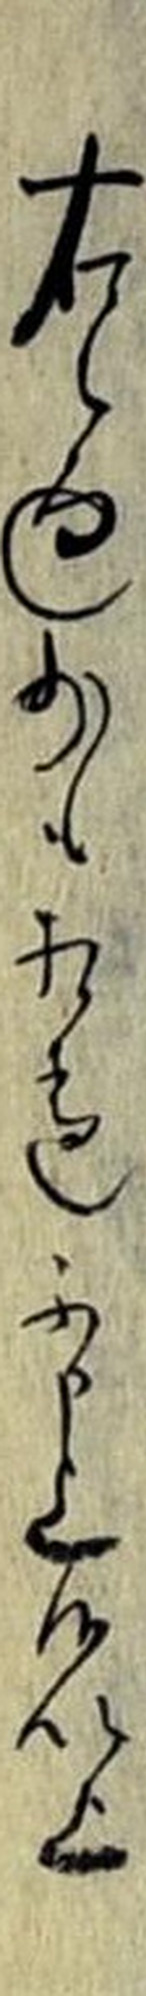右之通少も相違不申上候以上
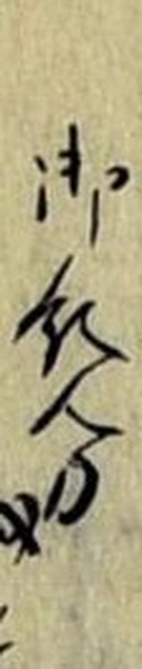御領分
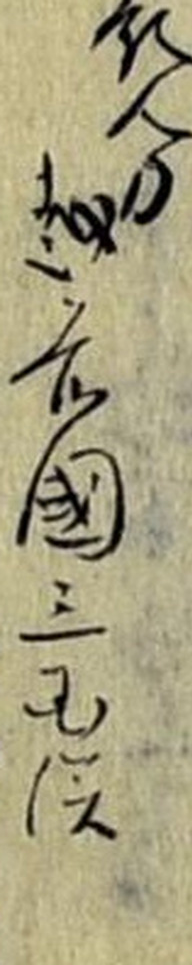越前国三国湊
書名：命令之部 三
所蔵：福井県文書館 Fukui Prefectural Archives
